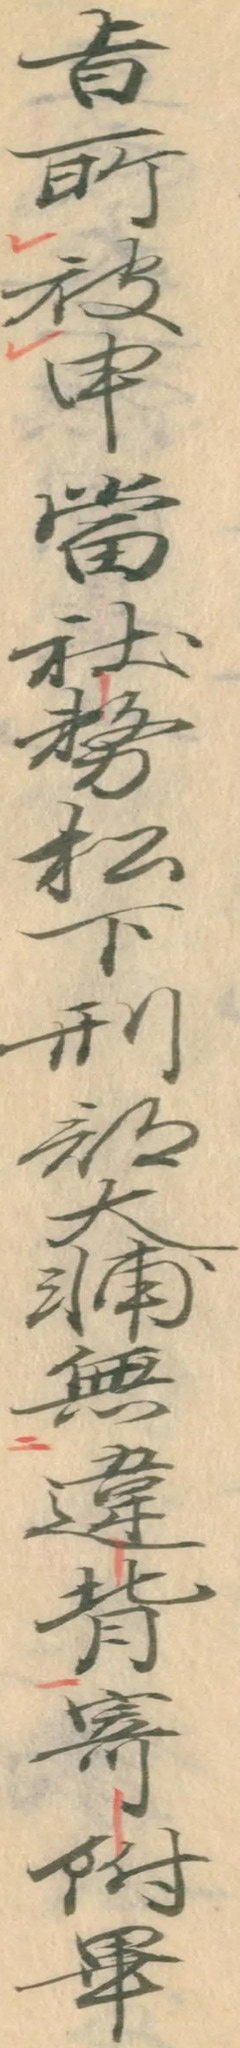旨所被申当社-務松下刑部大輔無違-背寄-附畢
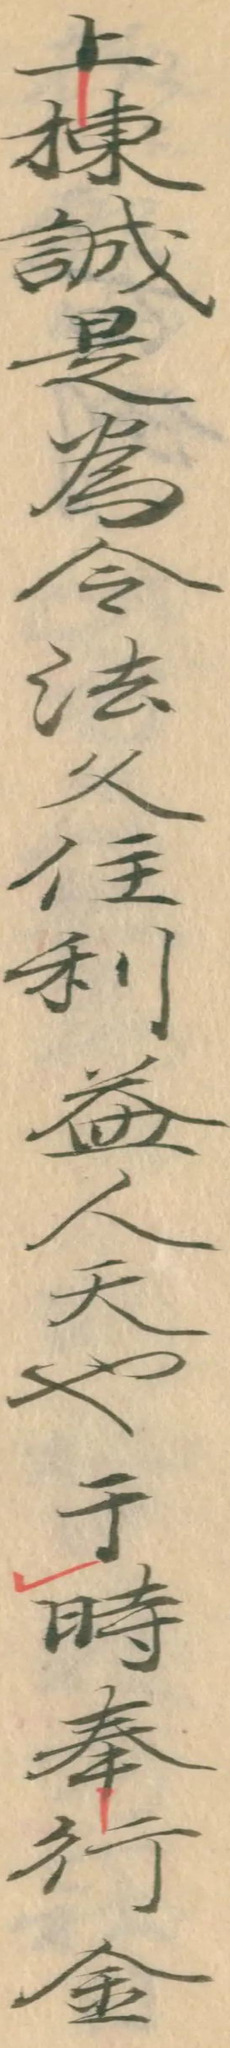上-棟誠是為令法久住利益人天也于時奉-行金
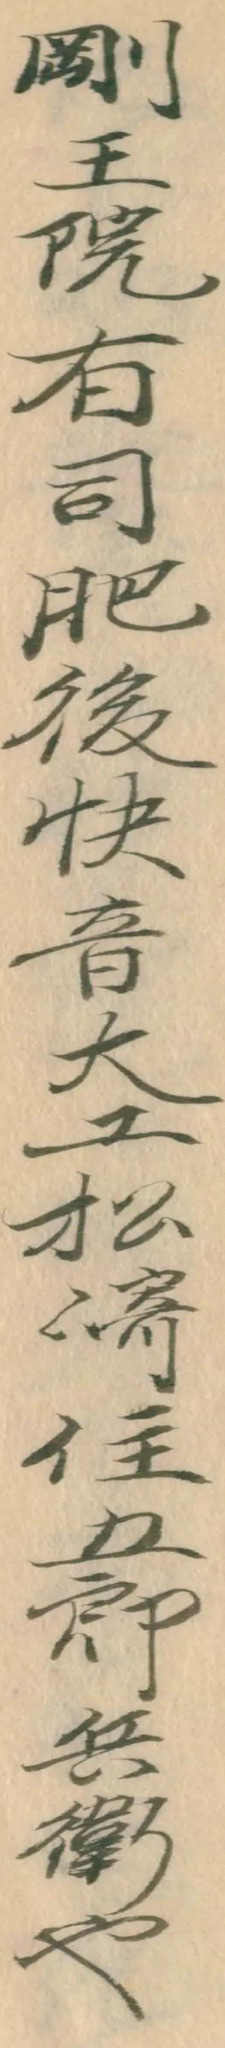剛王院有司肥後快音大工松崎住五郎兵衛也
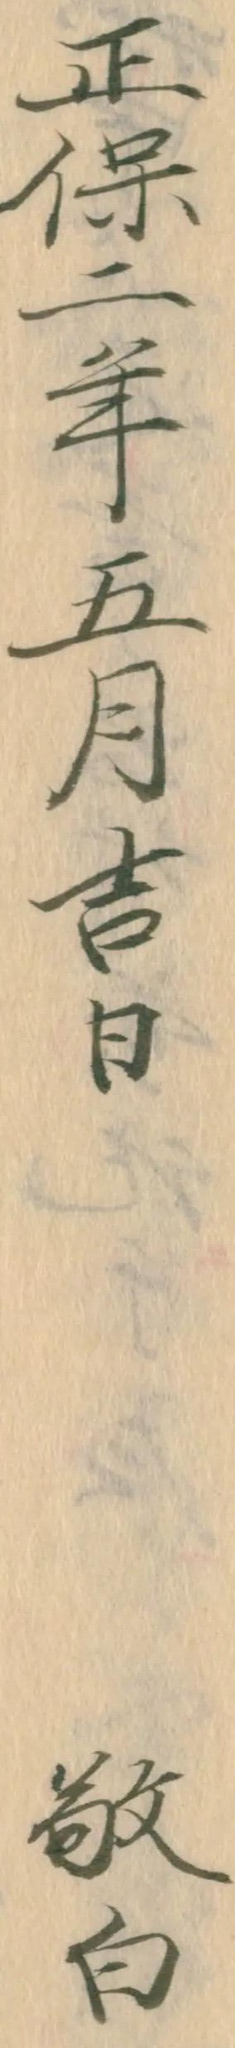正保二年五月吉日敬白
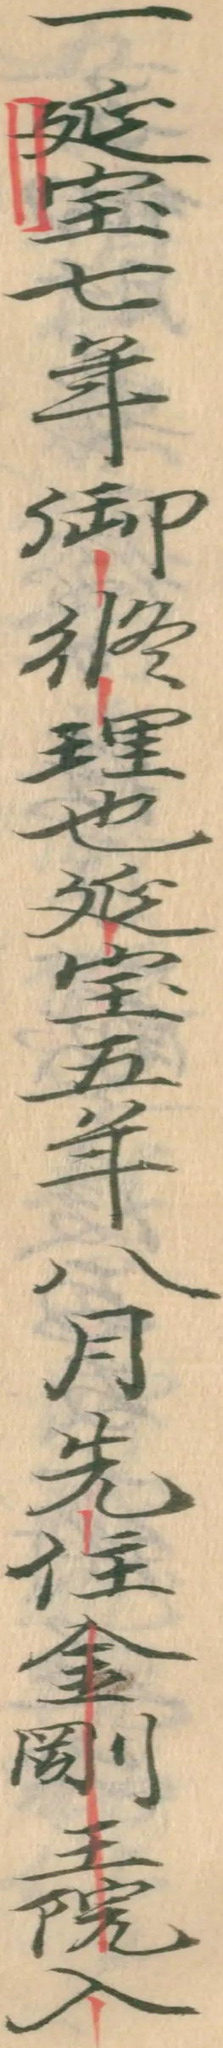一延宝七年御-修-理也延-宝五年八月先-住金剛王院入-
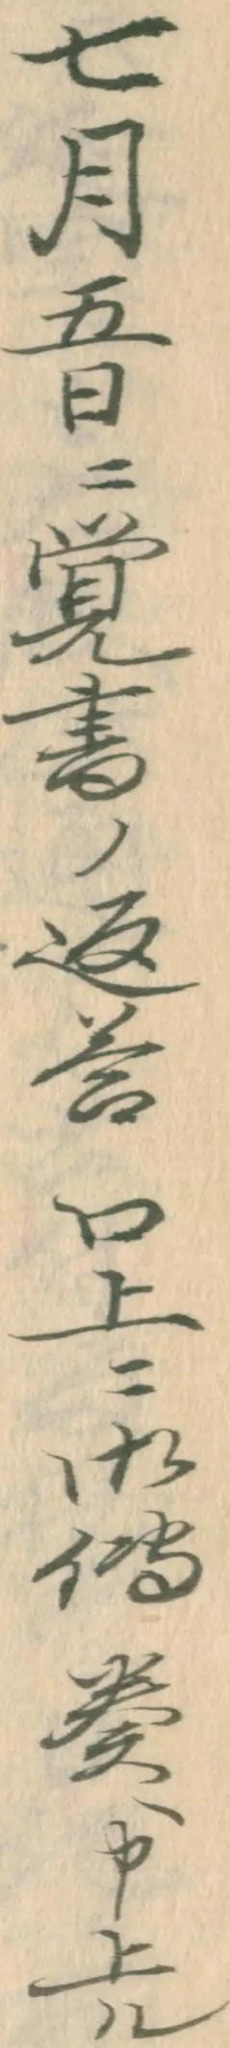七月五日ニ覚書ノ返答口上ニ御伝奏へ申上ル
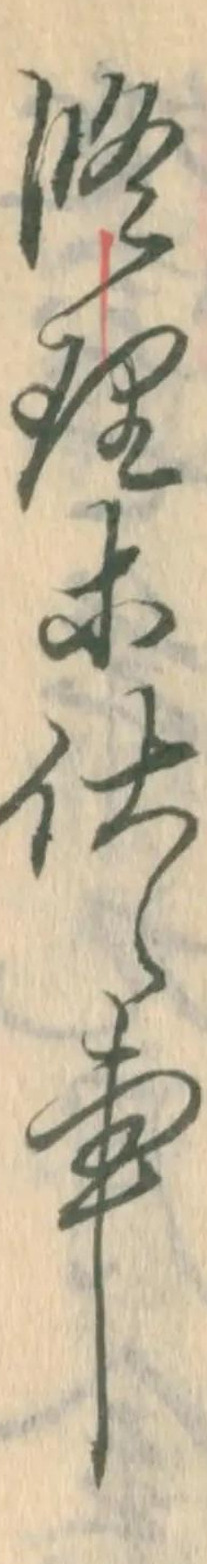修-理等仕候事
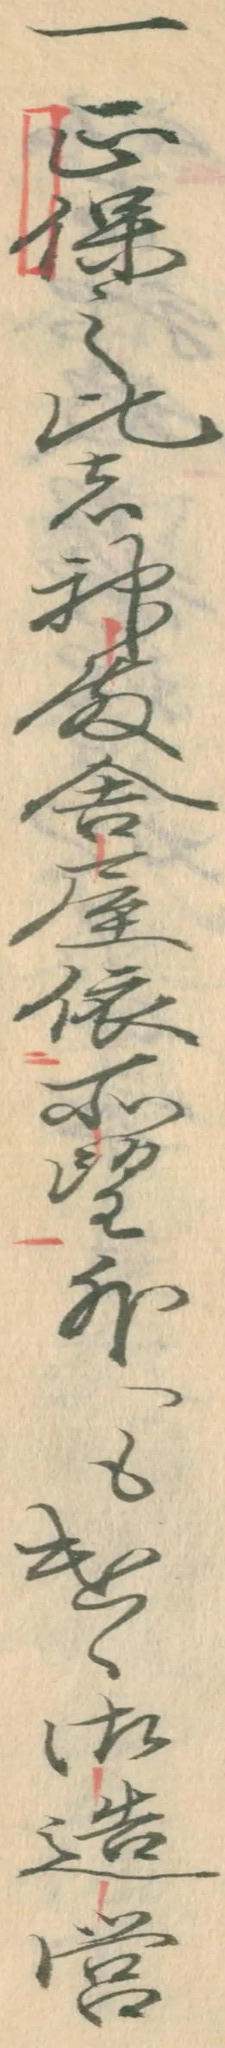一正保之比者神-殿舎-屋依所-望外へも遣候御-造-営

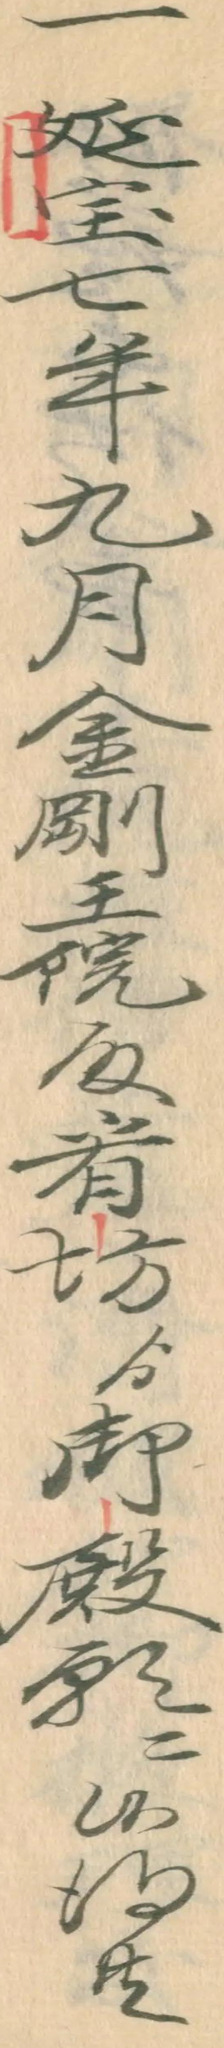一延宝七年九月金剛王院殿看-坊ゟ御-殿願ニ候得共
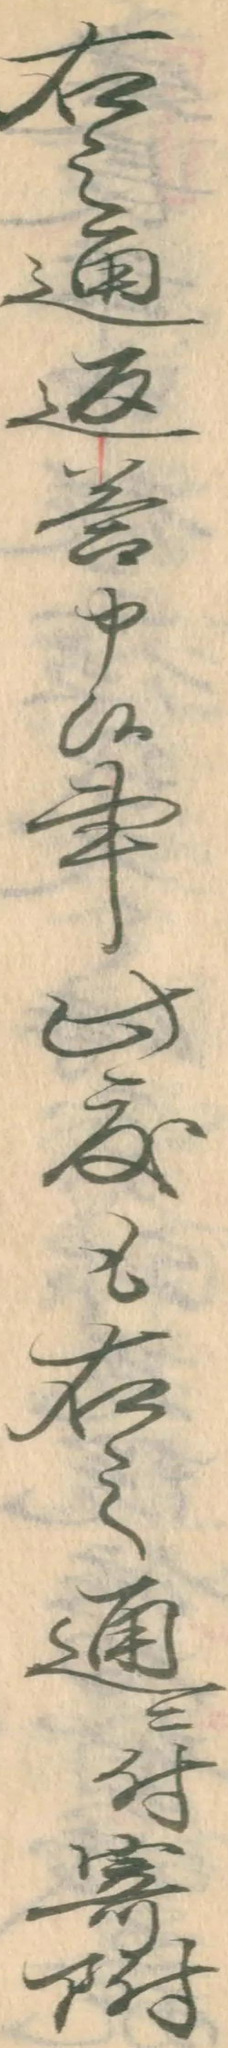右之通返-答申候事此度も右之通ニ付寄附
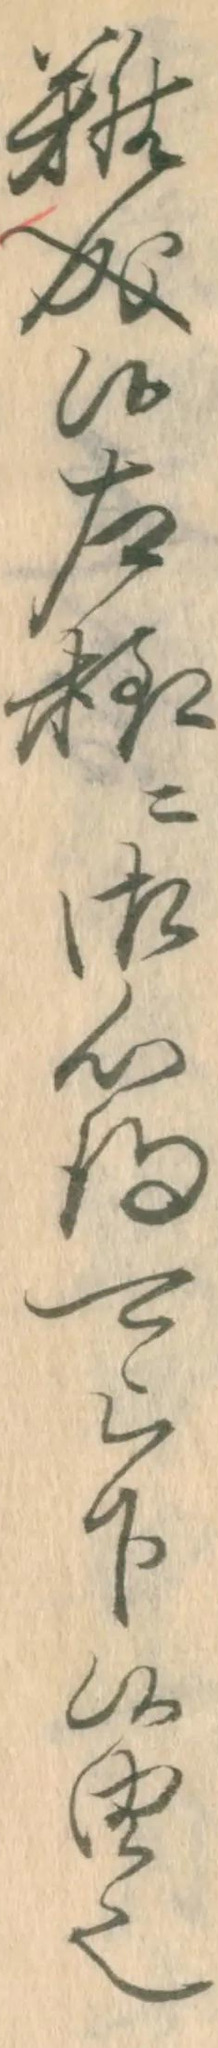難成候左様ニ御心得可被下候由也
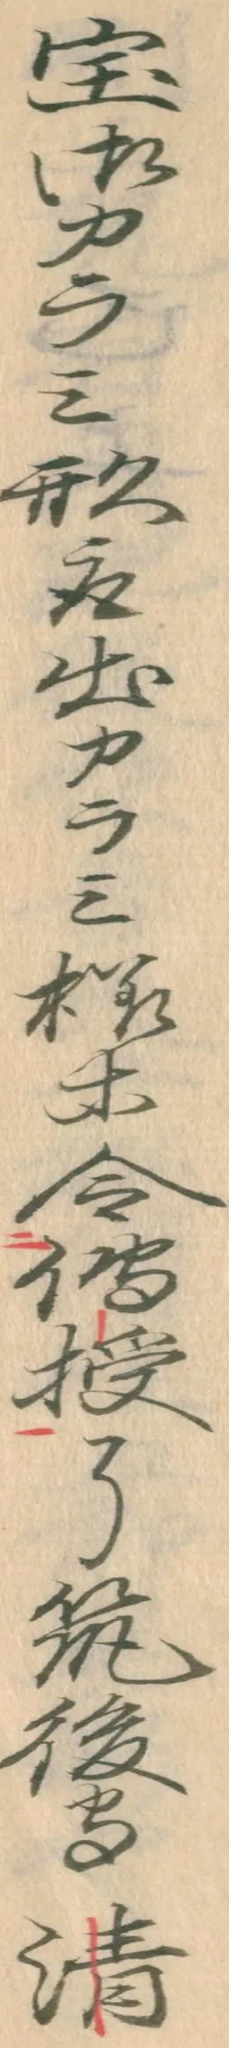宝御カラミ形取出カラミ様等令伝-授了筑後守清
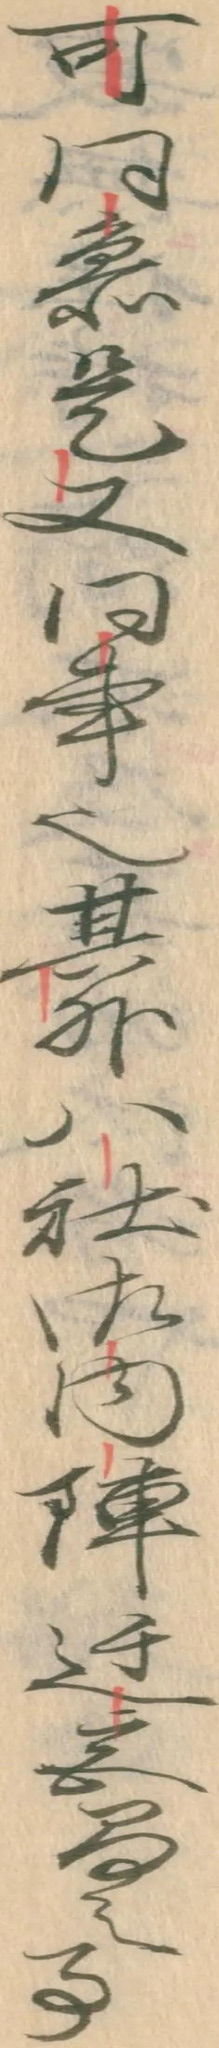可同-参是_又同-事也其_外八-社御-内-陣迁-宮間之事
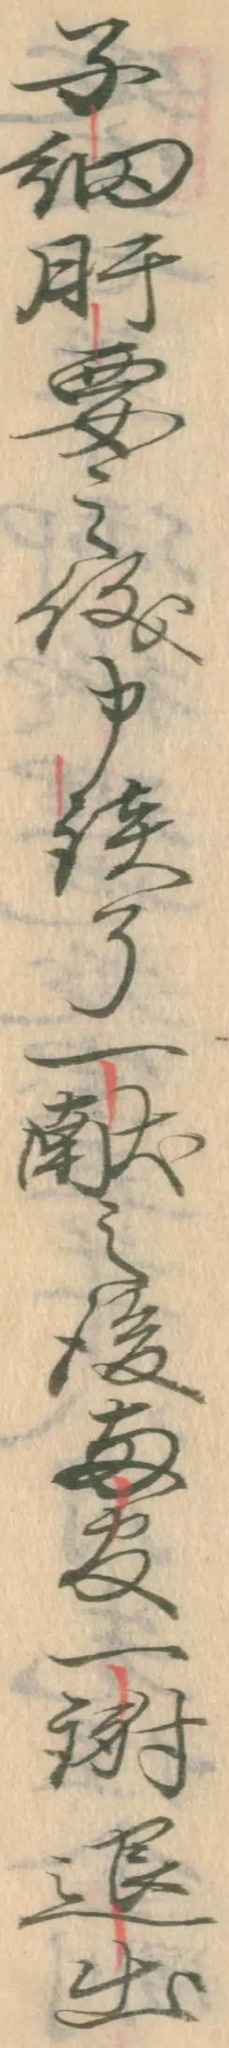子-細肝-要之儀申_談了一-献之後両-官一-謝退-出
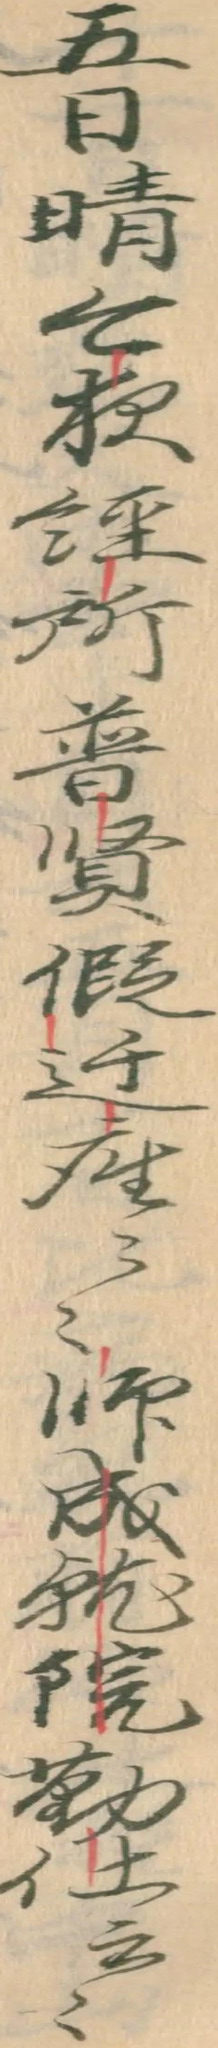五日晴今-夜経-所普-賢仮_迁-座々々-師成就院勤-仕云々
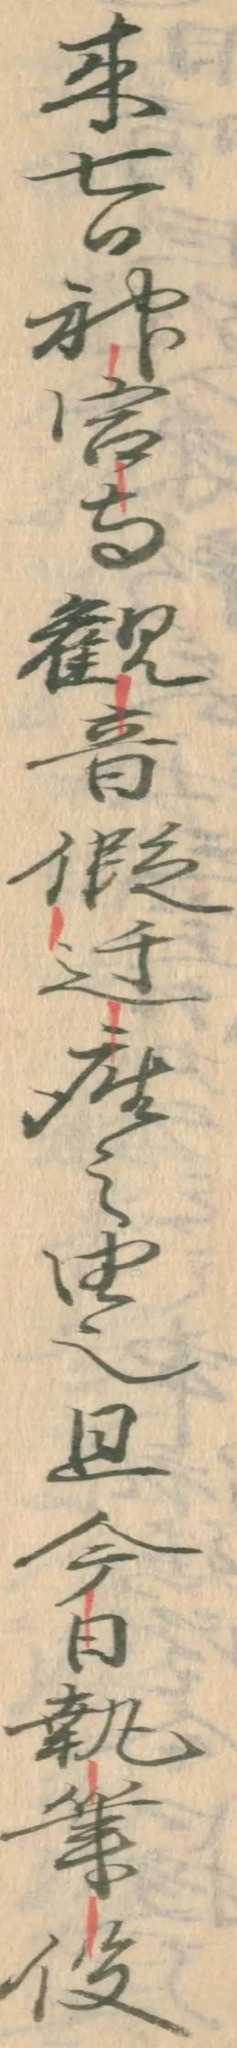来七日神-宮-寺観-音仮_迁-座之由也且今-日執-筆-役
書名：賀茂社記録. 第16冊
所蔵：国立国会図書館 National Diet Library, JAPAN
